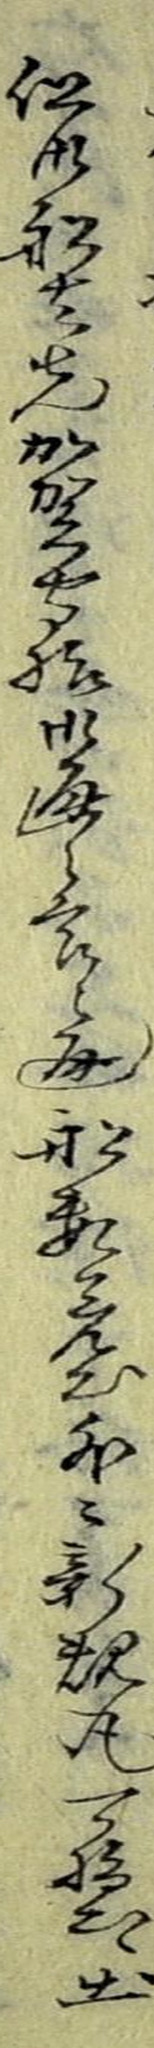但御船は先加賀守様御通之節之通船数差出外に新規丸可指出候出
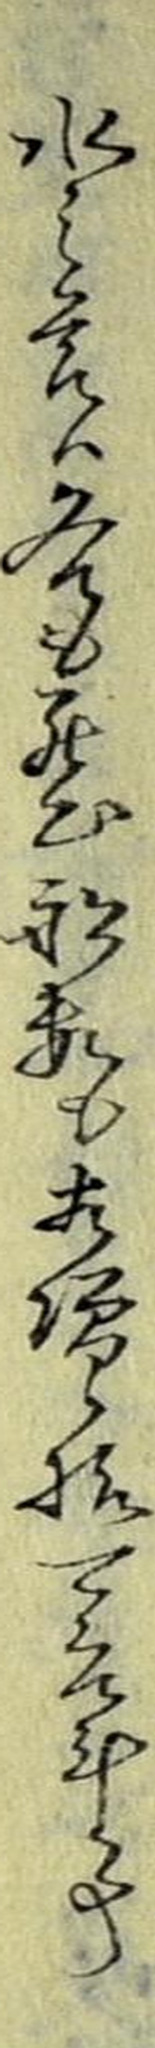水之節は各も罷出船数も相増候様可取斗事

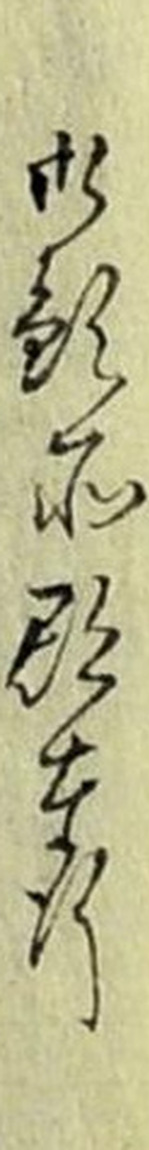御預所郡奉行
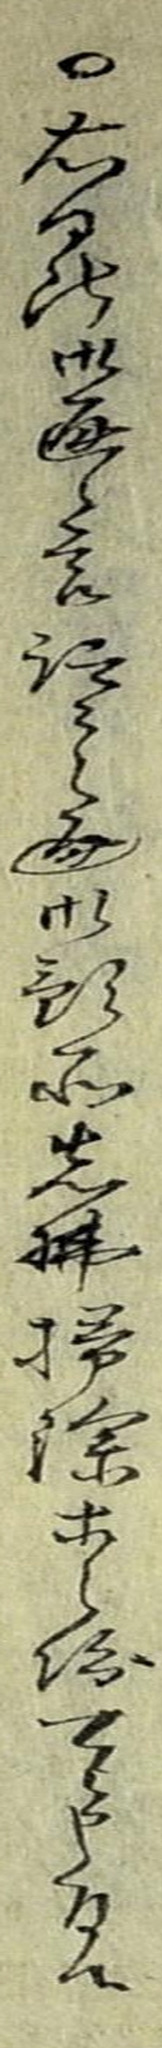○右同断御通之節跡々之通御預所先払掃除等之儀可申付候
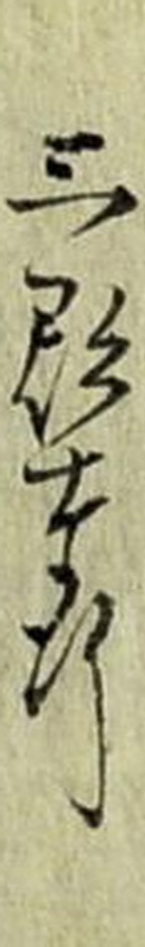三郡奉行
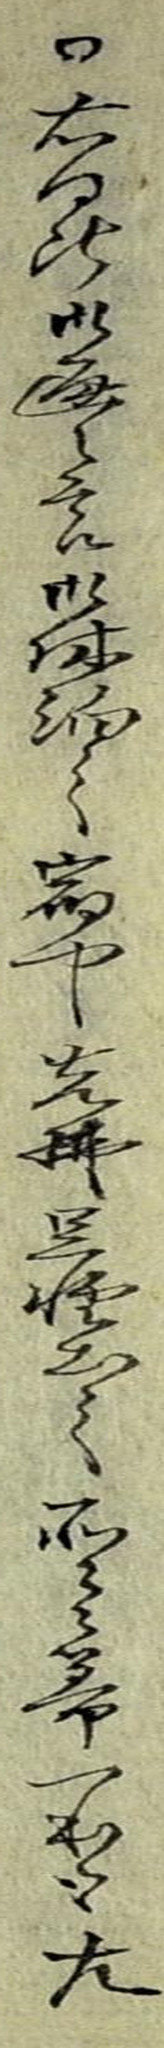○右同断御通之節御休泊之宿中先払足軽出之所々に箒一本つヽ尤
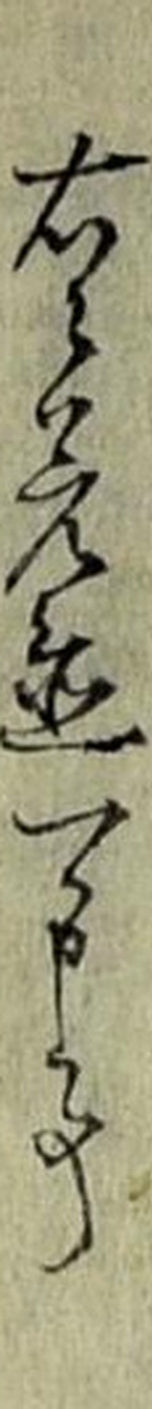右へ差置可申事
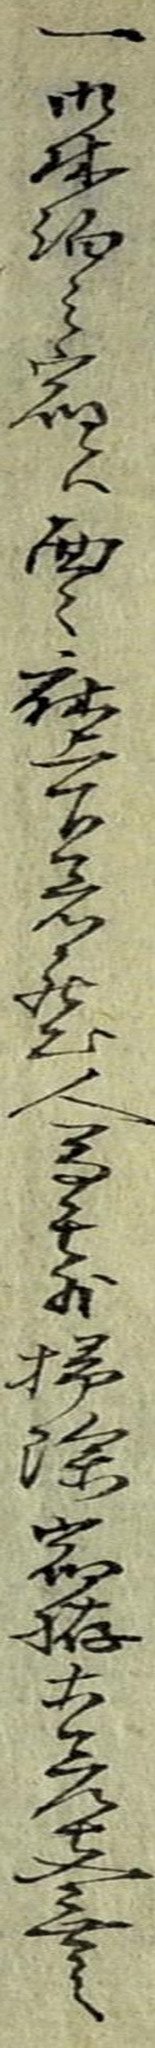一御休泊之宿へは面々麻上下着罷出人馬其外掃除宿拵相差支無之
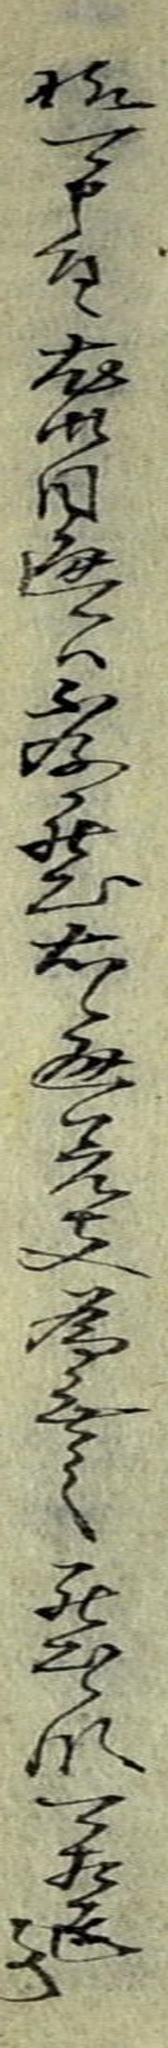様可申付候右御目通には不及候罷出右之通差支為無之罷出候段可相達事
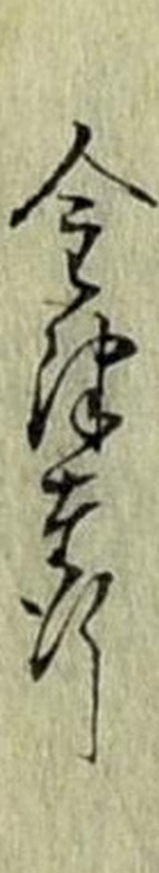金津奉行
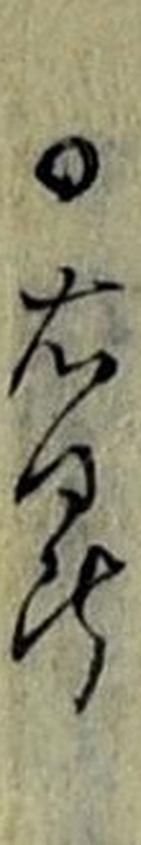○右同断
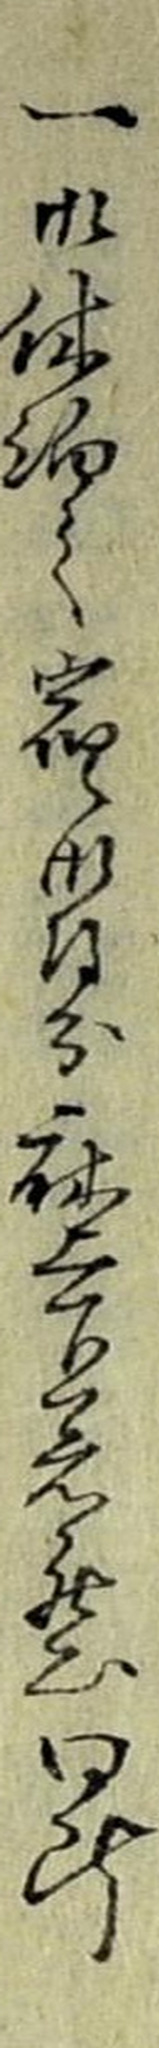一御休泊之宿へ御自分麻上下着罷出同断
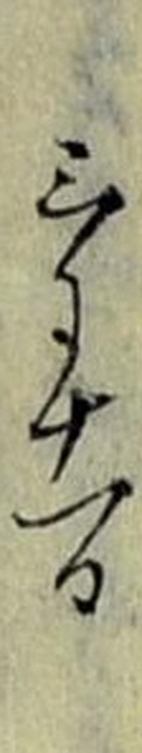三月十一日
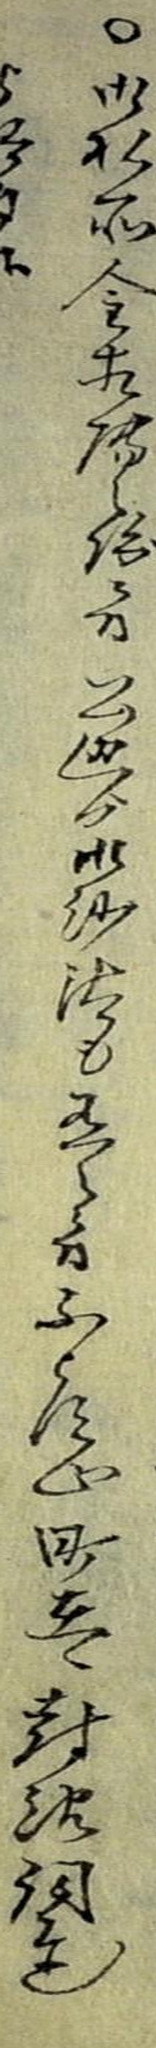○御札所金相場之儀に付公辺ゟ御沙汰も有之に付不被得止町在へ封銀調達
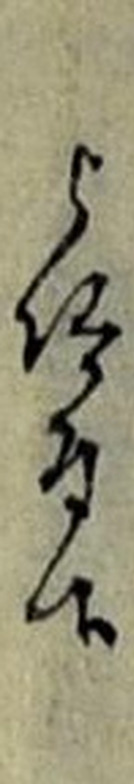被仰付候
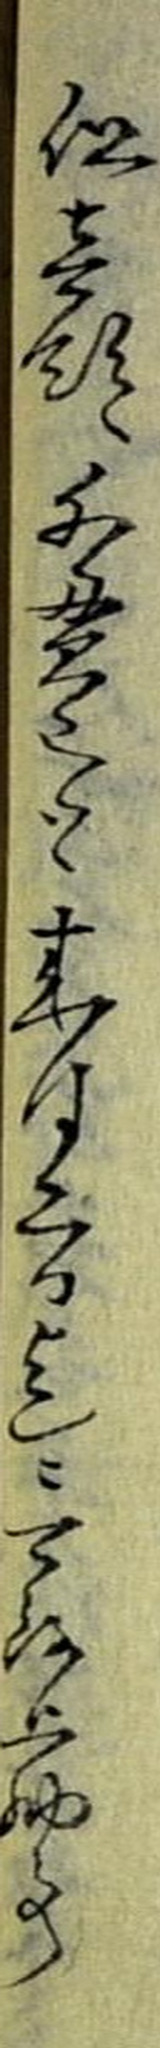但壱領へ千貫匁つヽ来月二日迄に可致上納事
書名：命令之部 六
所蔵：福井県文書館 Fukui Prefectural Archives
